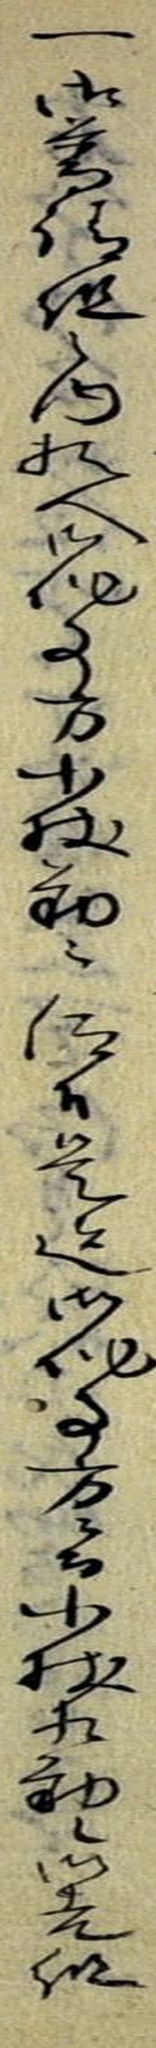一御普請組之内拾人御作事方小杖勤被仰付是迄御作事方に而小杖相勤候御先組
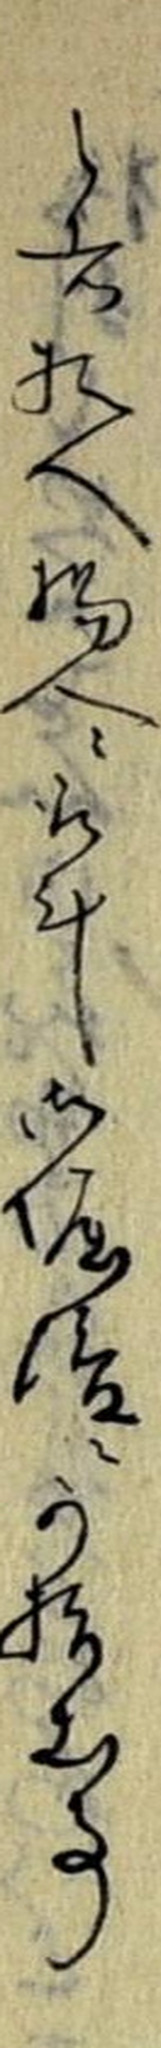之者拾人揚人に取斗御堀浚に可指出事
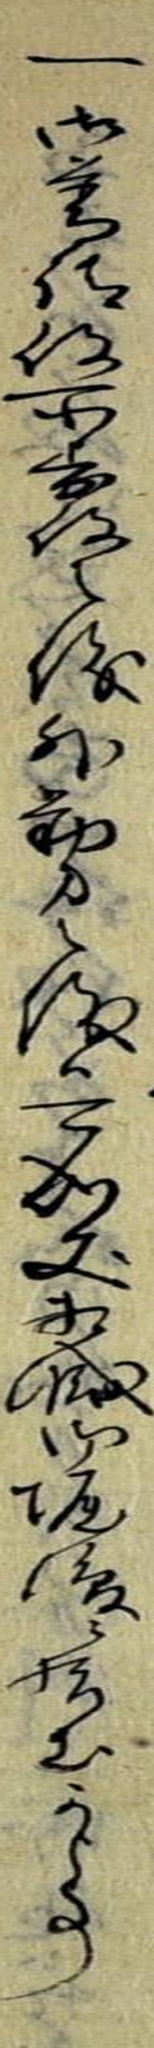一御普請役所歩役之儀外勤方之儀は可成丈相減御堀浚に指出可申事
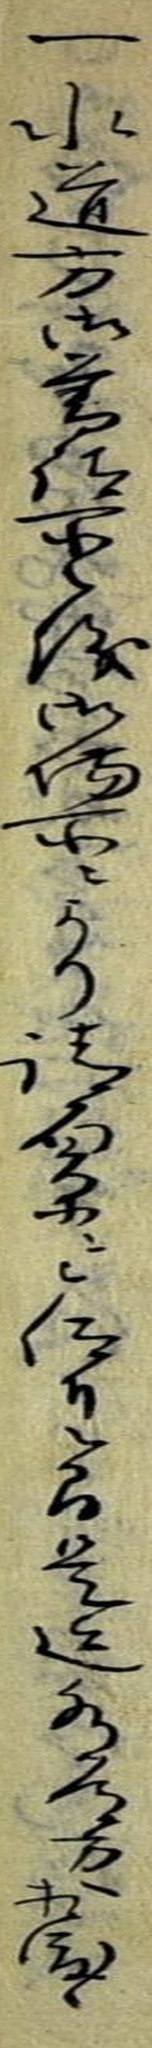一水道方御普請所之儀御場所により請負等に被仰付候間是迄水道方へ相渡候
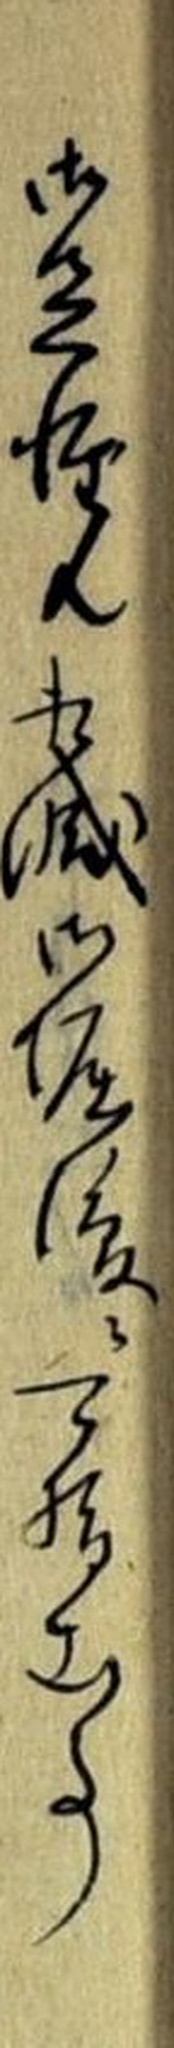御足軽共相減御堀浚に可指出事
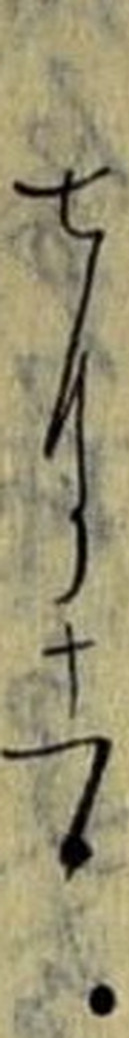七月十一日
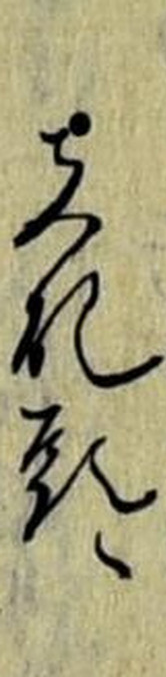支配頭へ
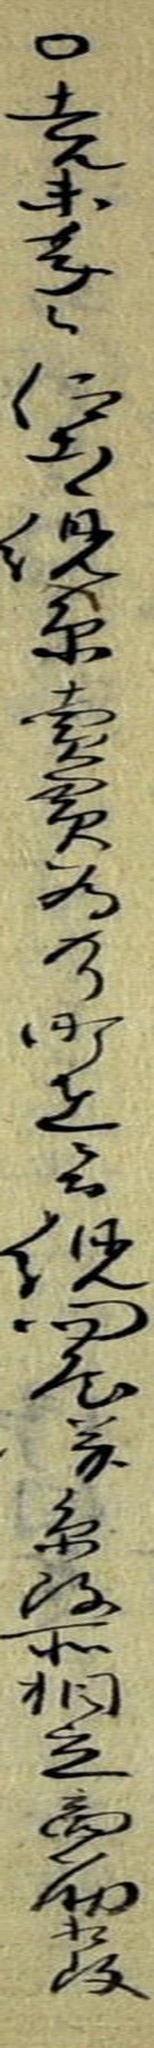○去ル未年被仰出候繭糸商買為〆り町在に而繭問屋并糸改所相立商筋相改
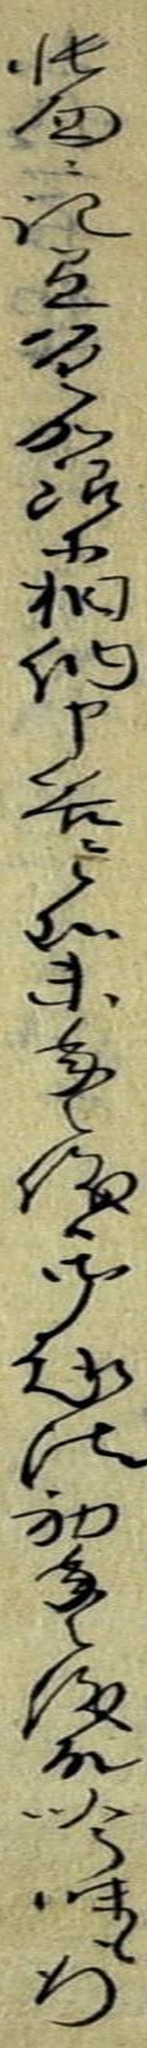帳面に記置冥加銀等相納申筈に候処未年之儀は御趣法初年之儀故吟味も行
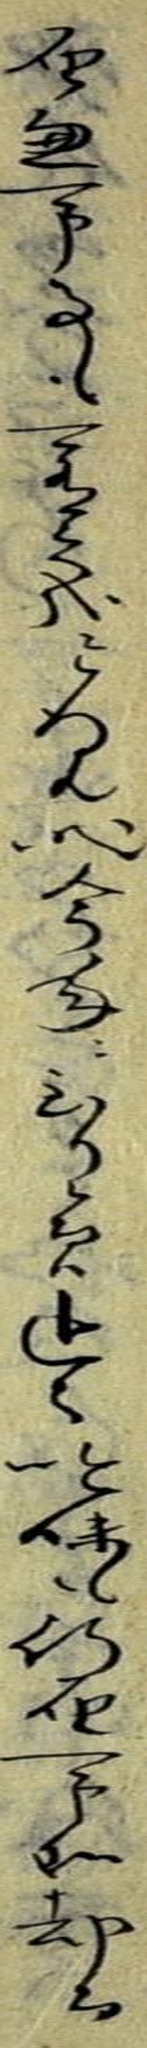届兼可申事も可有之候哉に候得共昨今年に至り候而は追々吟味も行届可申処却而
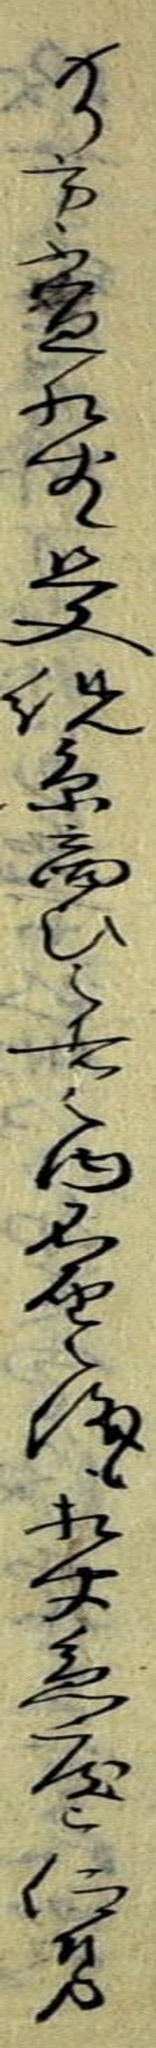〆り方不宜相聞候且又繭糸商ひ之者之内不届之儀も相聞急度被仰付候
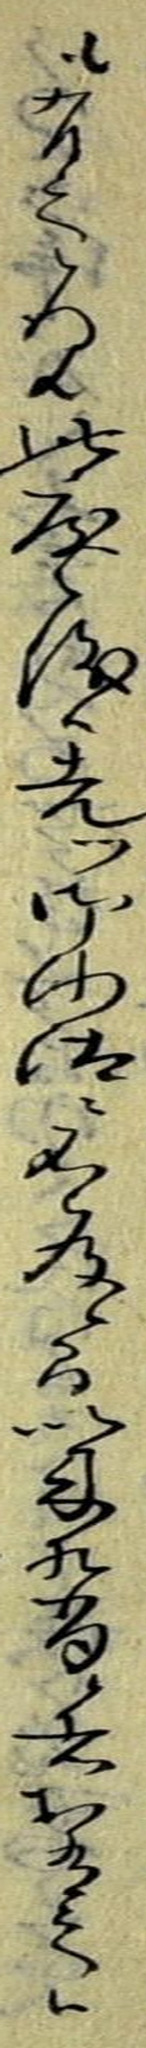も有之候得共此度之儀は先つ御沙汰に不被及候間以来相背候者於有之は
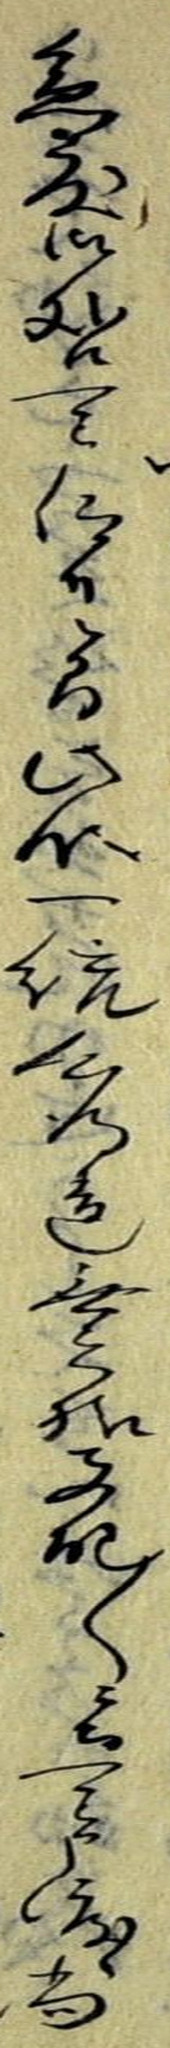急度御咎可被仰付候間此段一統心得違無之様支配〳〵に而可被申渡候尚
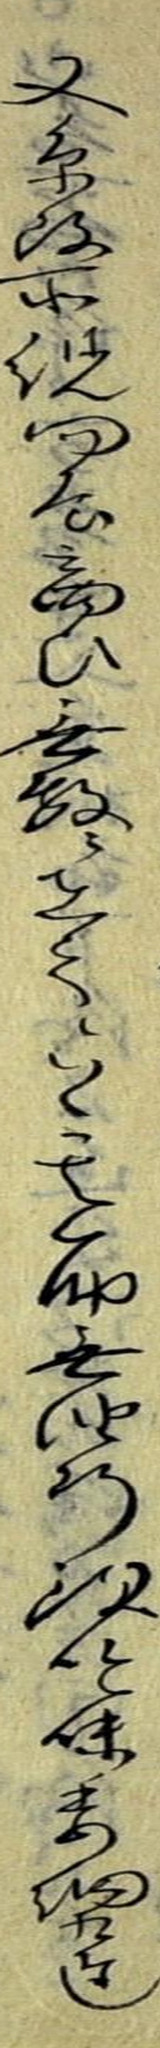又糸改所繭問屋商ひ無数に在之候はヽ其筋無由断致吟味委細相達
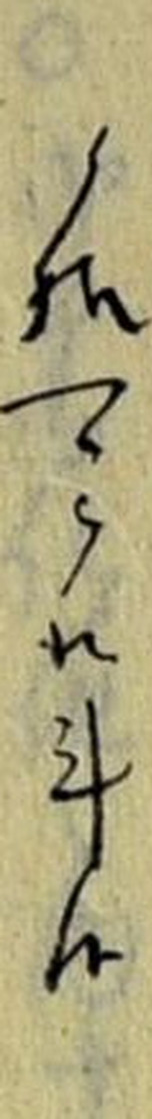候様可被取斗候
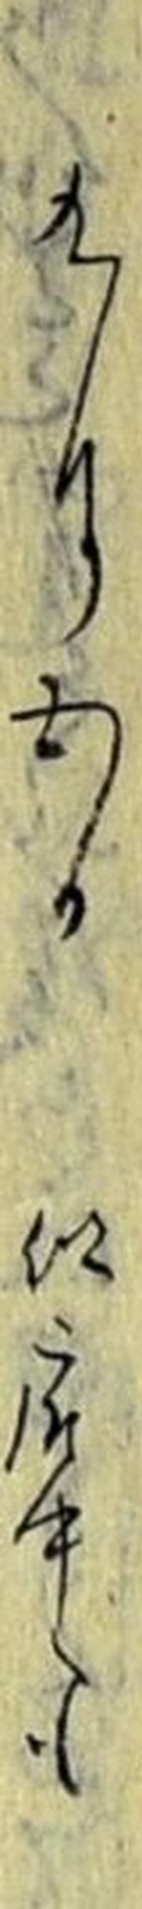九月五日但府中へも
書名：命令之部 四
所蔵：福井県文書館 Fukui Prefectural Archives
